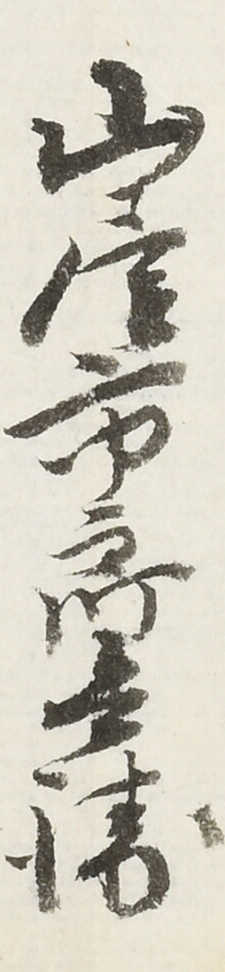山屋市郎兵衛
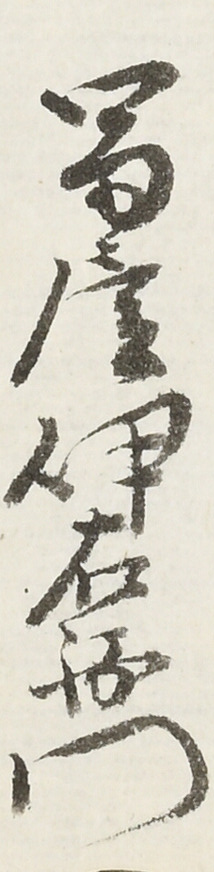冨屋伊右衛門㊞
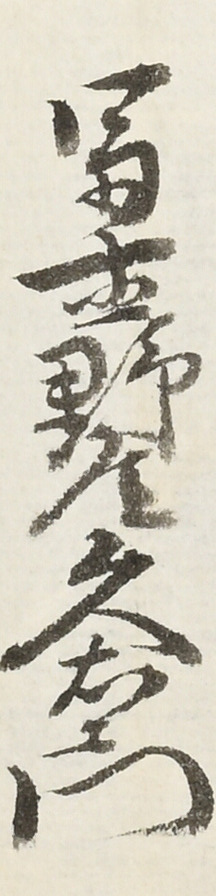冨士野屋久右衛門
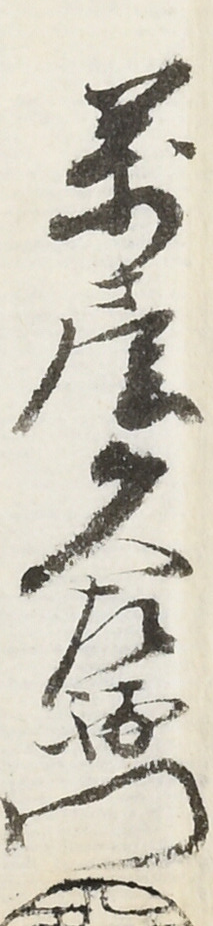万屋久左衛門㊞
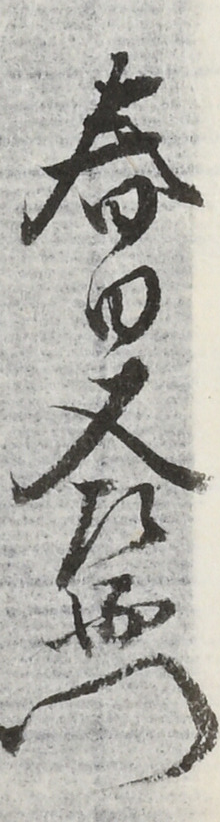春日又左衛門

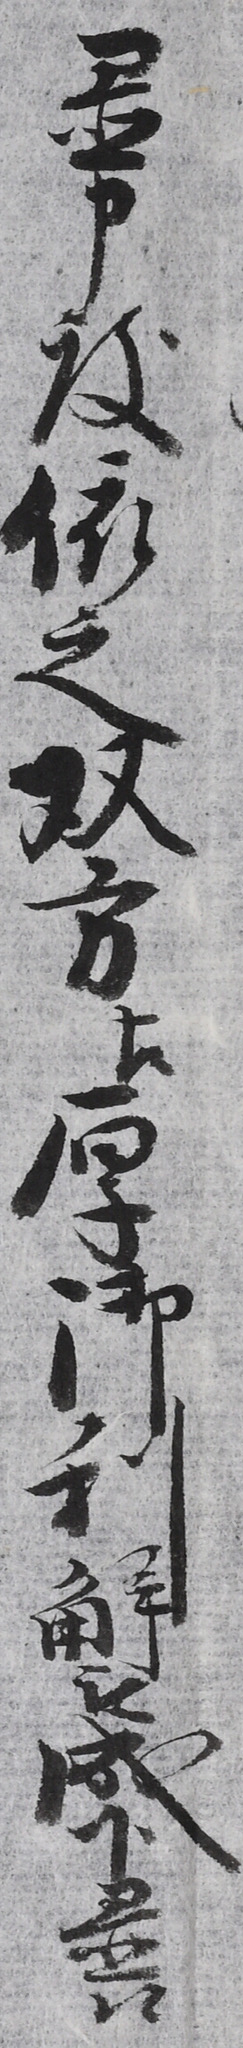置申致依之双方江厚御利解被成下置候
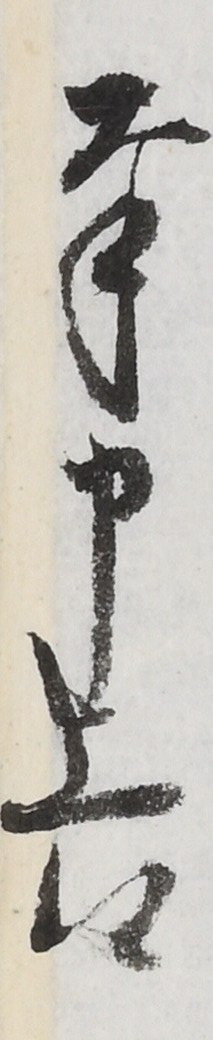奉申上候
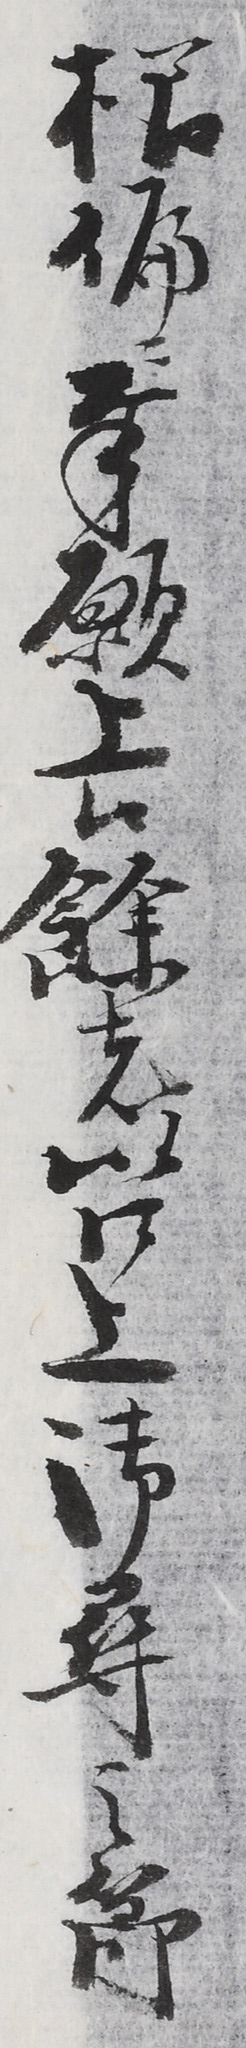様偏ニ奉願上候余者以口上御尋之節
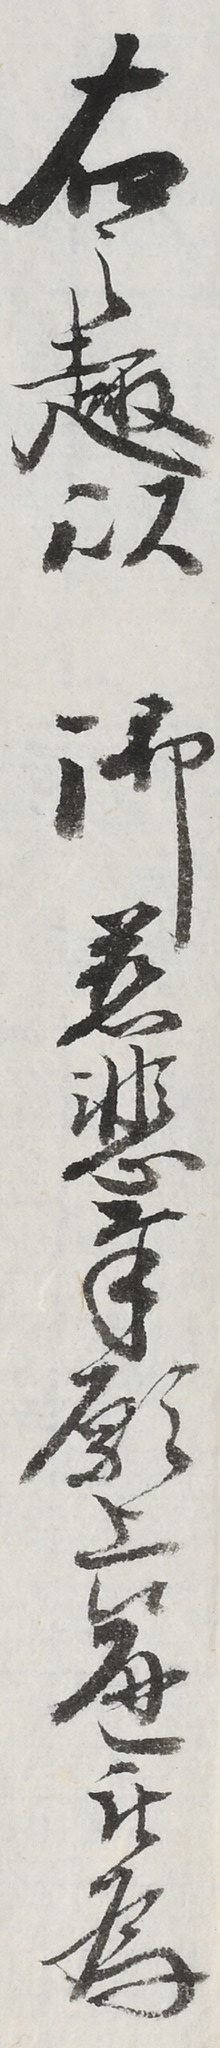右之趣以御慈悲奉願上候通被為
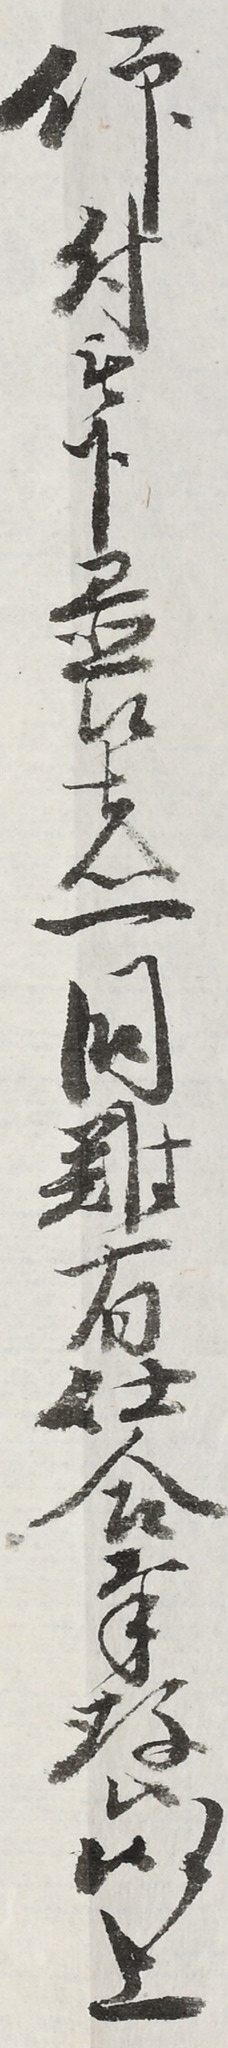仰付被下置候者一同難有仕合奉存候以上
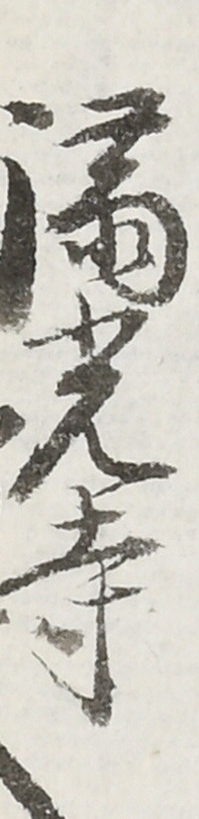満光寺
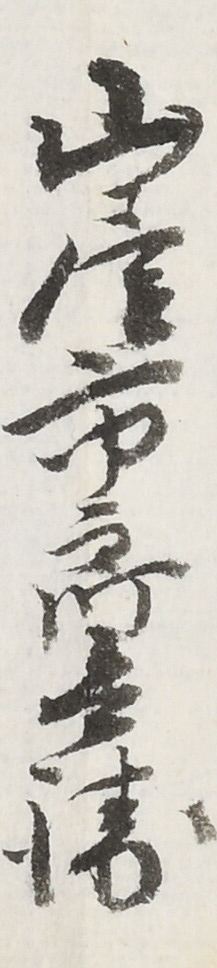山屋市郎兵衛
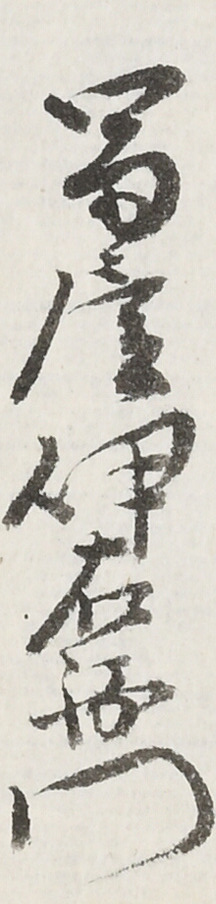冨屋伊右衛門㊞
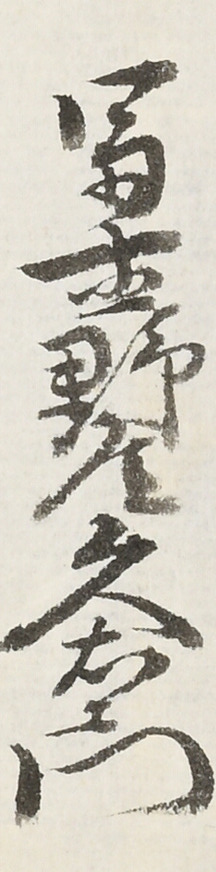冨士野屋久右衛門
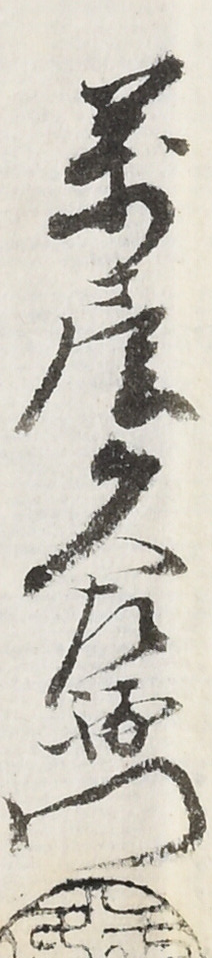万屋久左衛門㊞
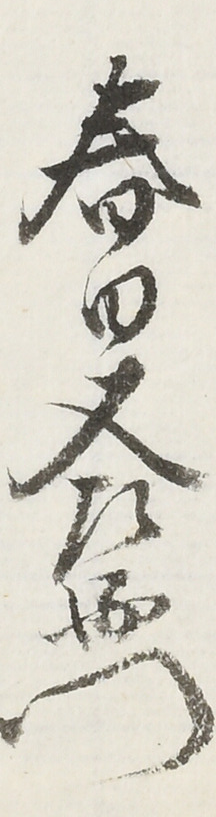春日又左衛門
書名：乍恐以口上書奉願上候御事
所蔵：伊那市立高遠町図書館・合同会社AMANE
